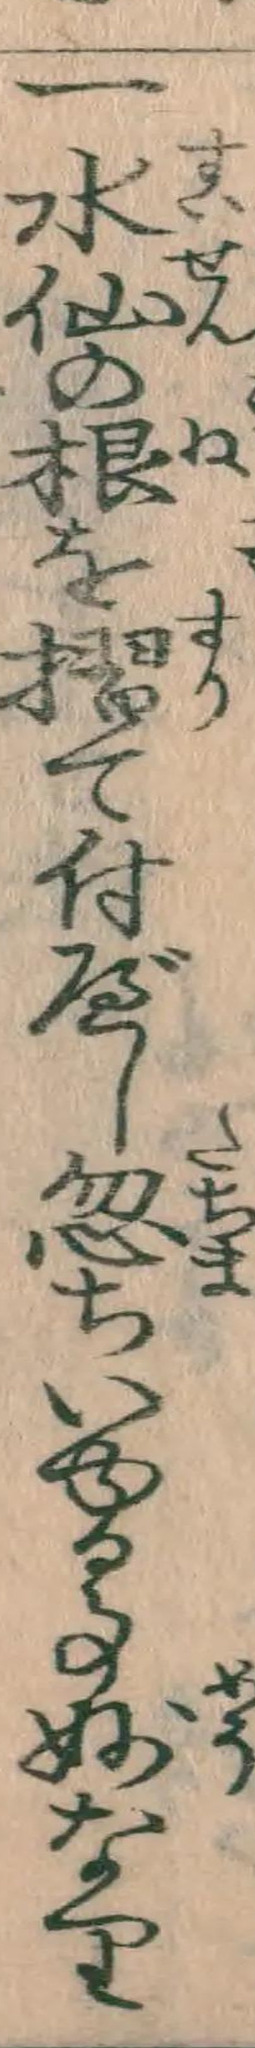一水仙の根を摺て付べし忽ちいゆる事妙なり
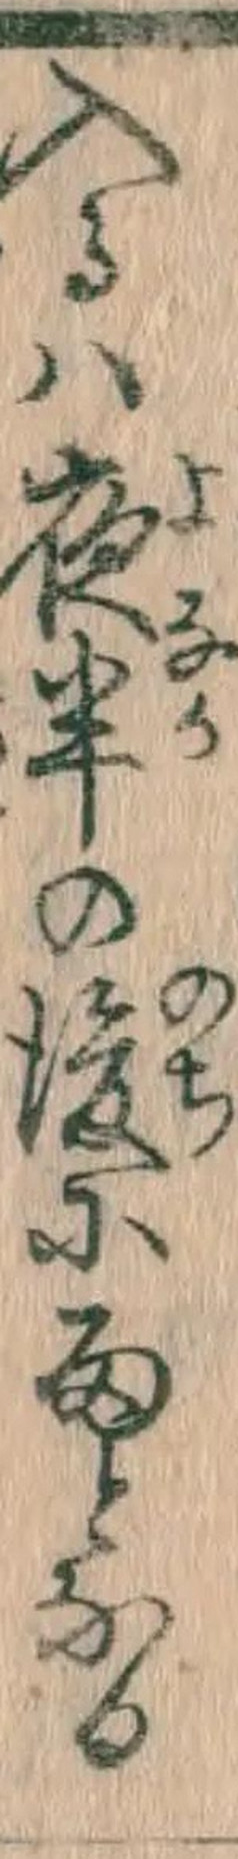入るは夜半の後に雨となる
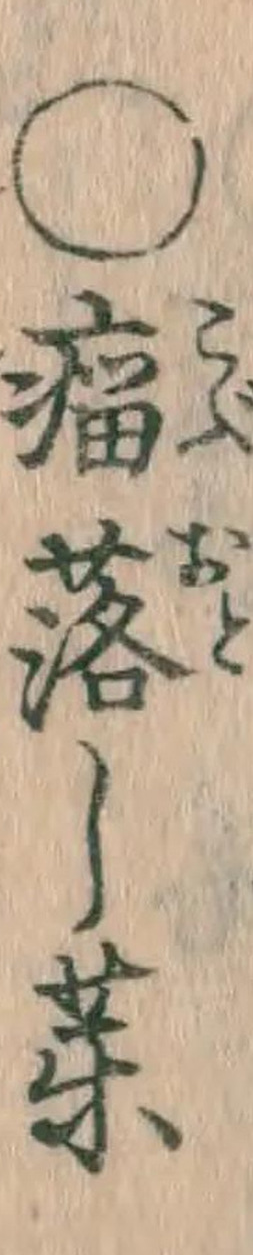○瘤落し薬
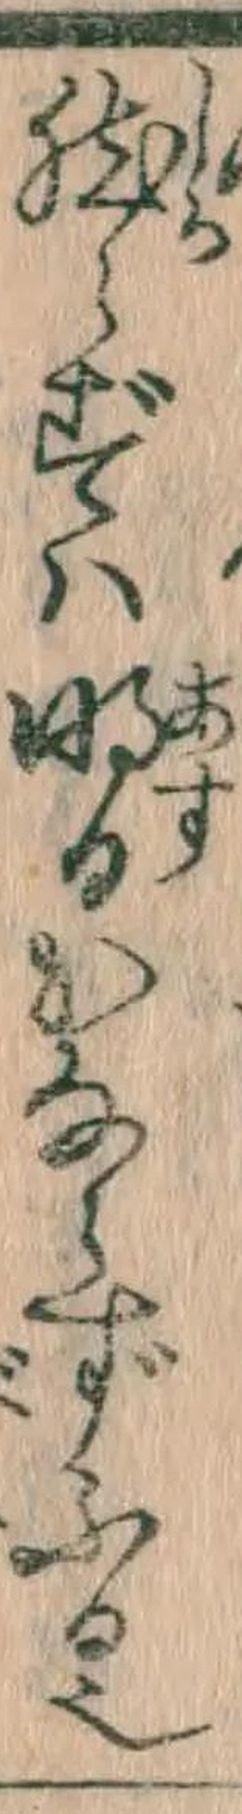然らずは明日かならずふる也
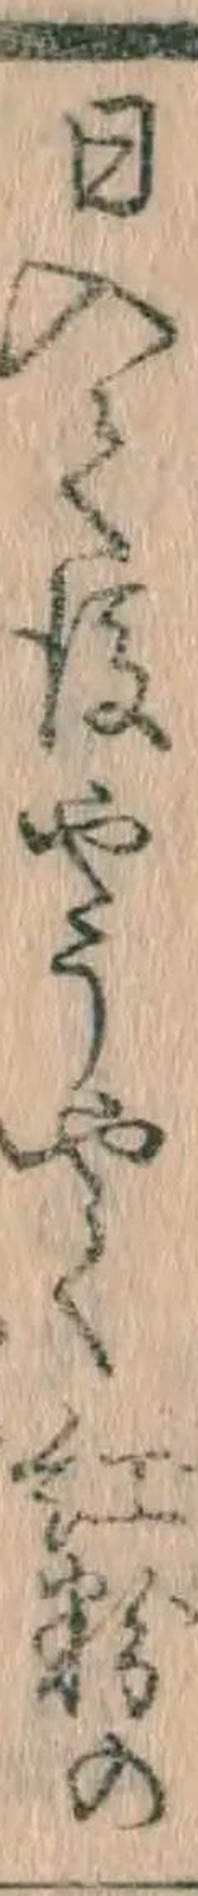日入て後やうやく紅粉の
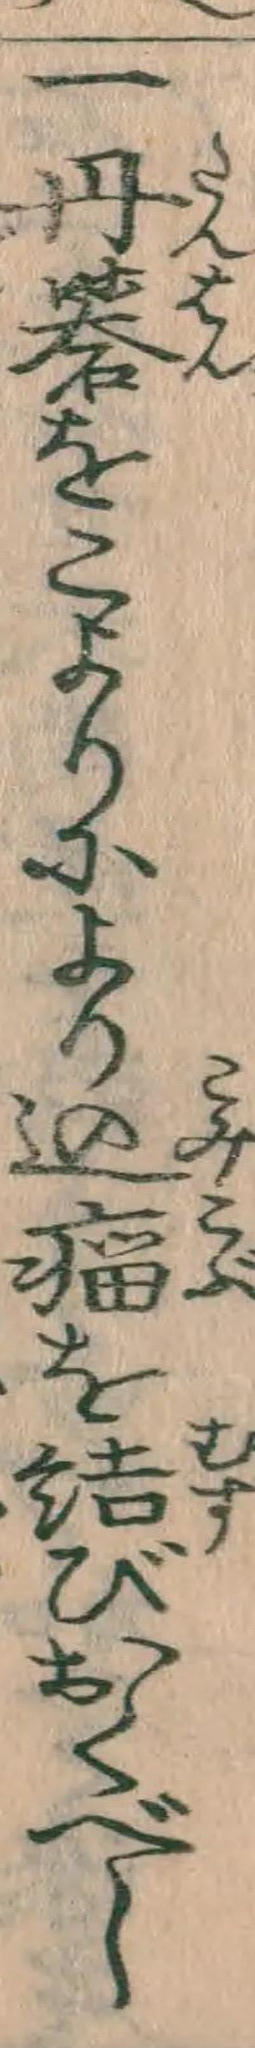一丹礬をこよりにより込瘤を結びおくべし
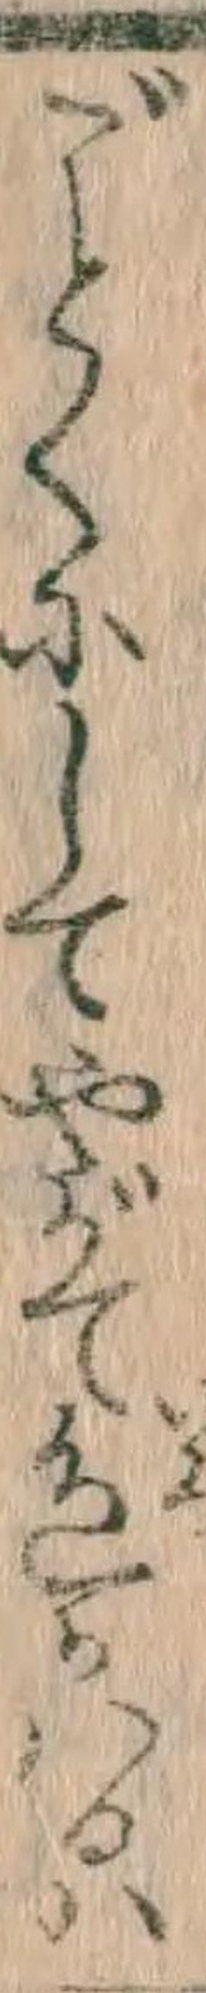ごとくにしてやがて色かはるは
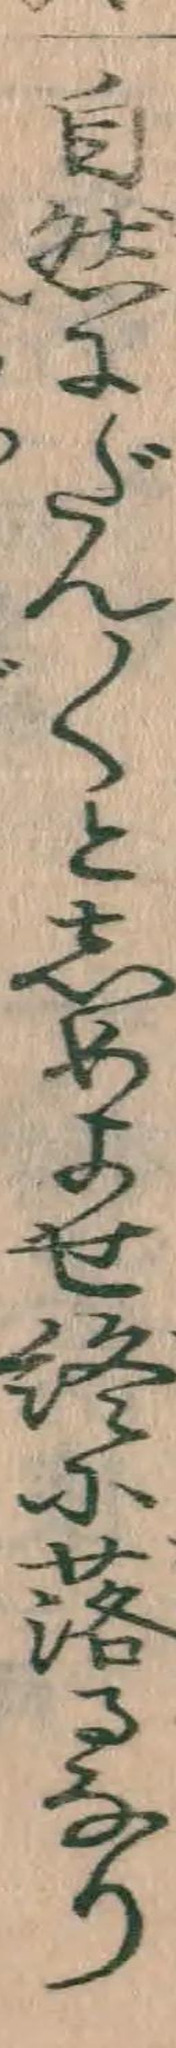自然にだん〳〵としめよせ終に落るなり
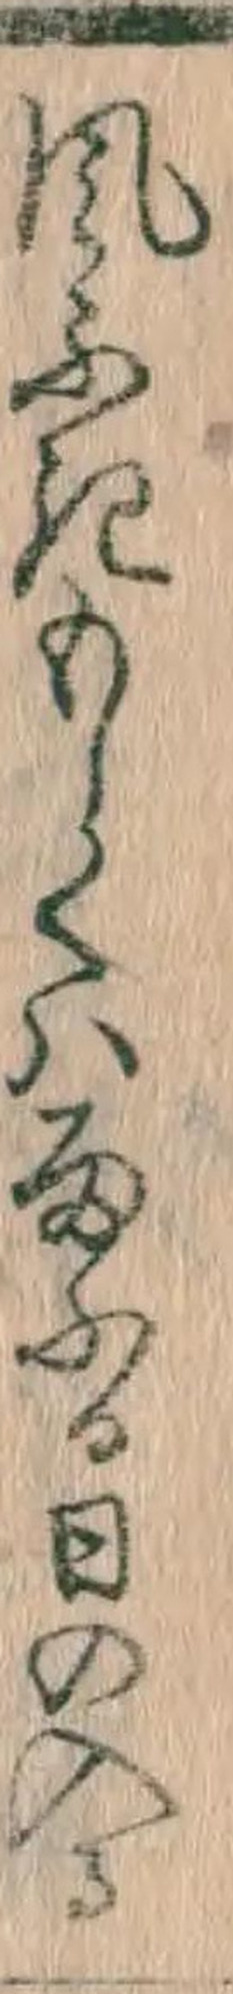風ふきもしくは雨ふる日の入る
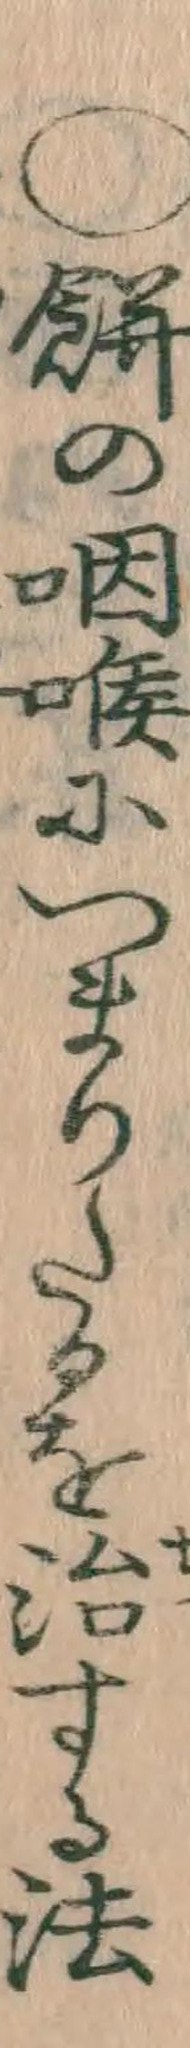○餅の咽喉につまりたるを治する方法
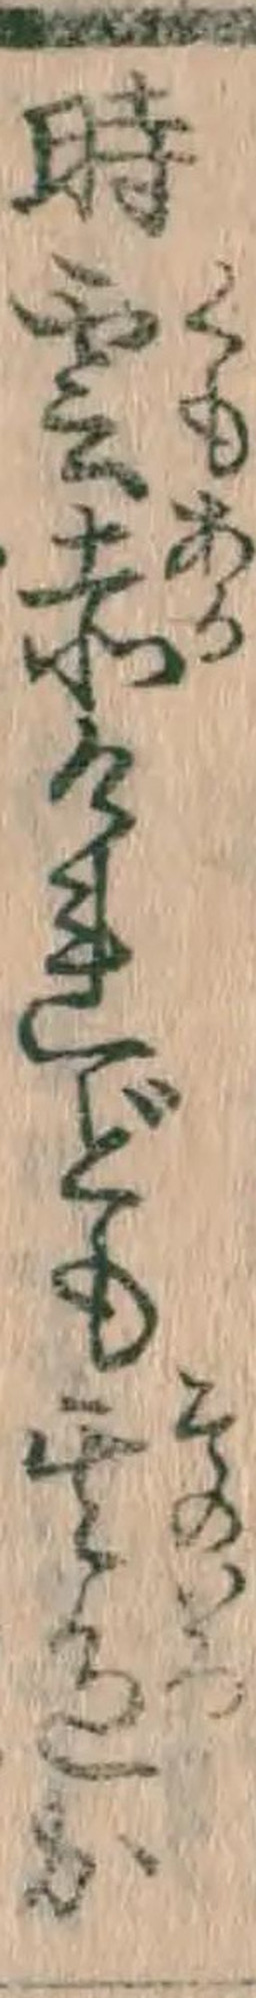時雲赤けれども其色か
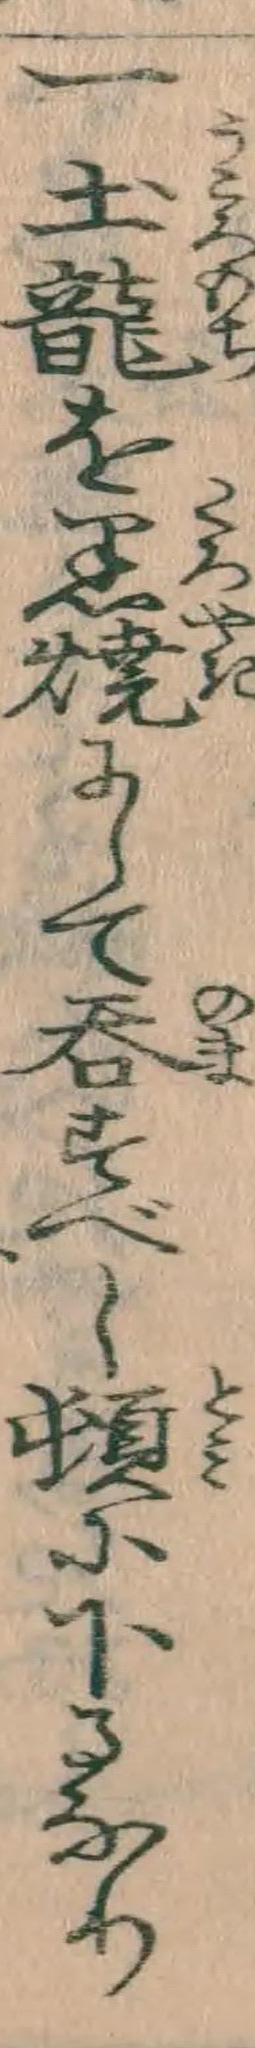一土龍を黒焼にして吞すべし頓に下るなり
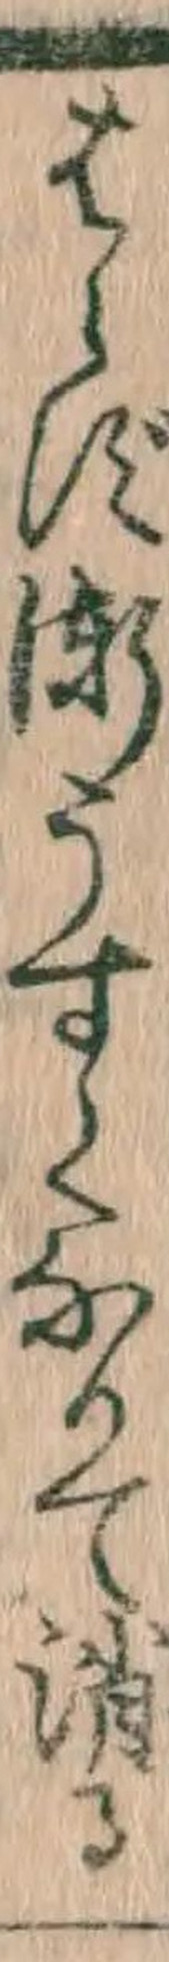はらず漸うすくなりて消る
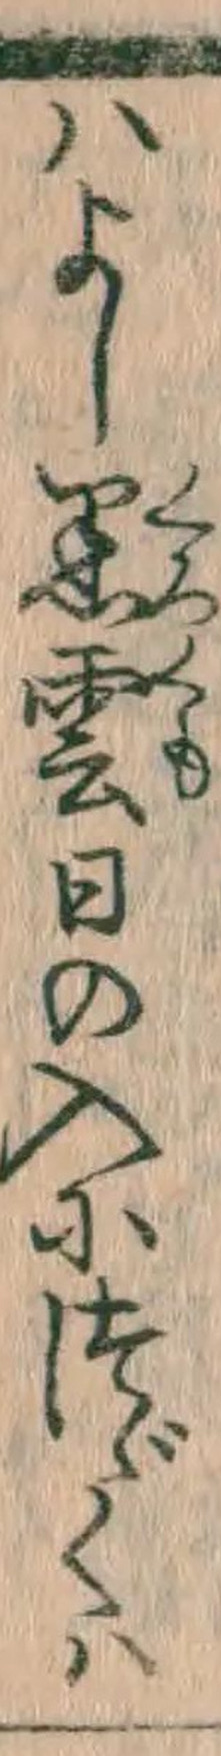はよし黒雲日の入につゞくは
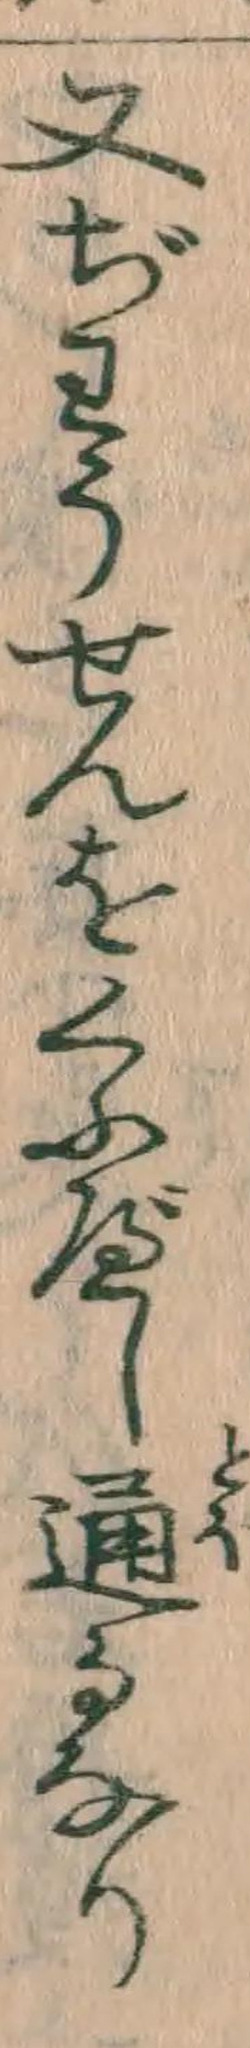又ぢわうせんをくふべし通るなり
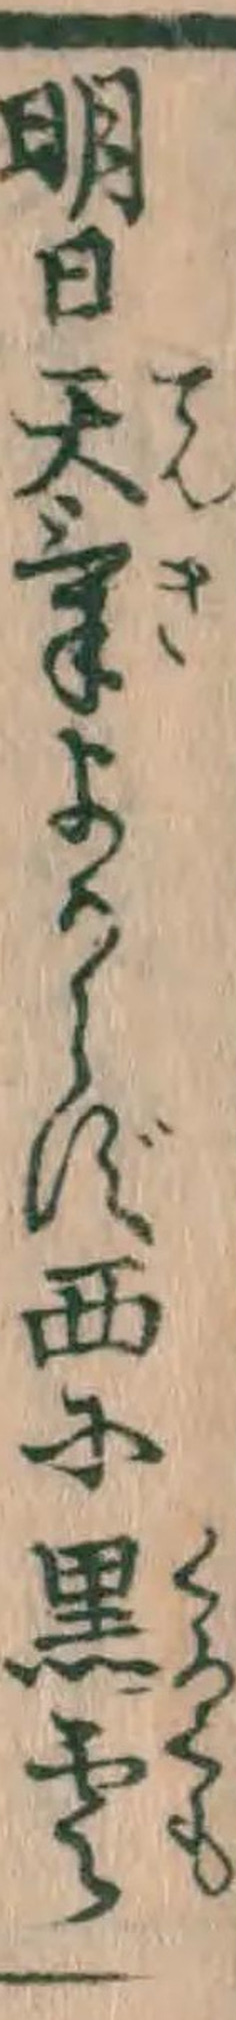明日天気よからず西に黒雲
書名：広益秘事大全 3巻. [3]
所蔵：国立国会図書館 National Diet Library, JAPAN
